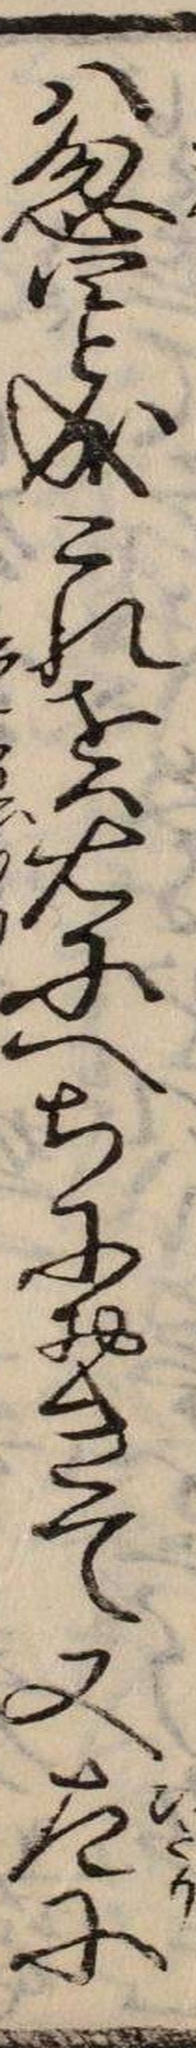八忽四と成これをは右にへちにおきて又左に
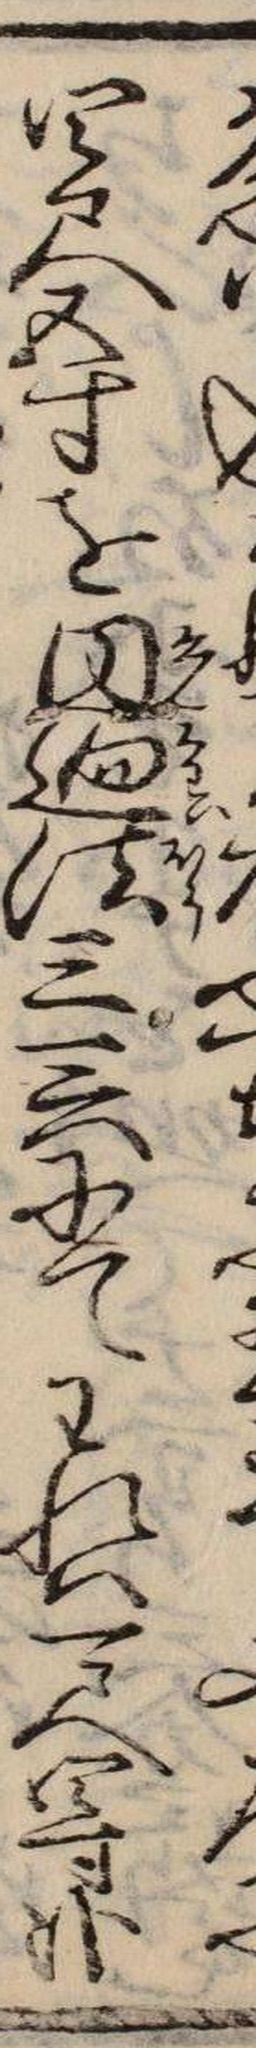四尺五寸を円廻法三一六にてわれは一尺四寸弐
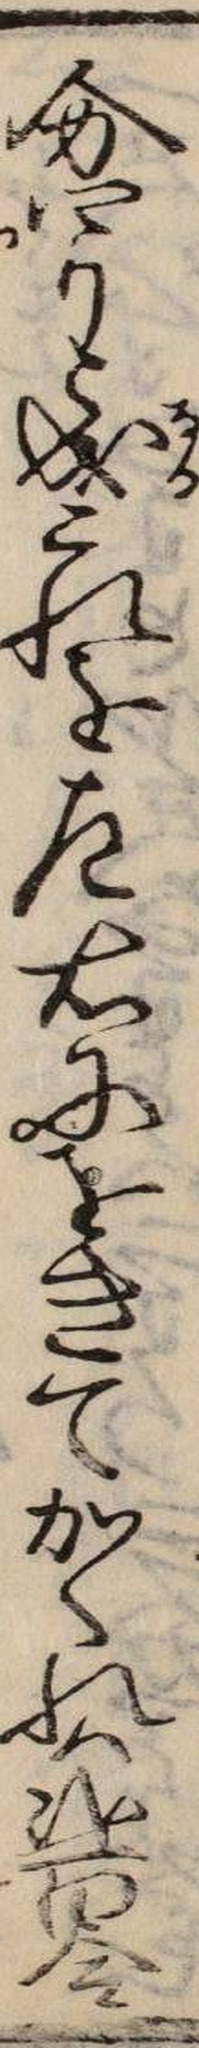分四りと成これを左右にをきてかくれは弐百令
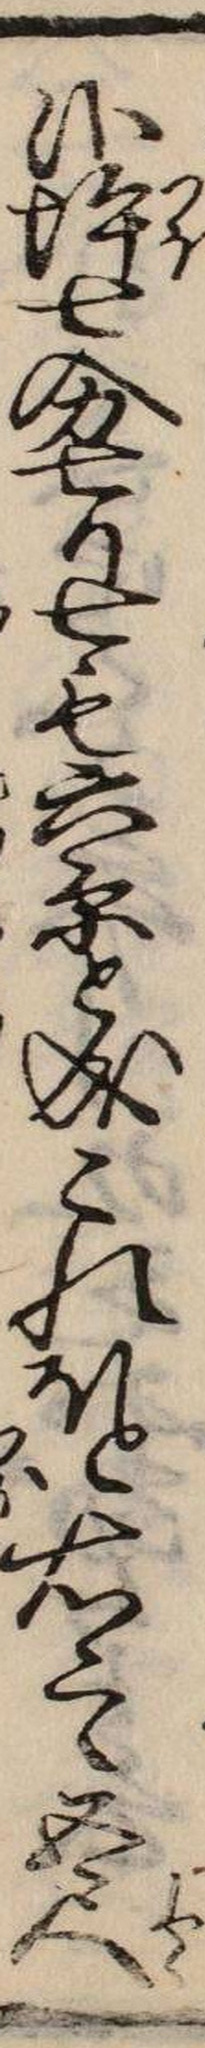弐坪七分七り七毛六糸と成これほと右の五尺
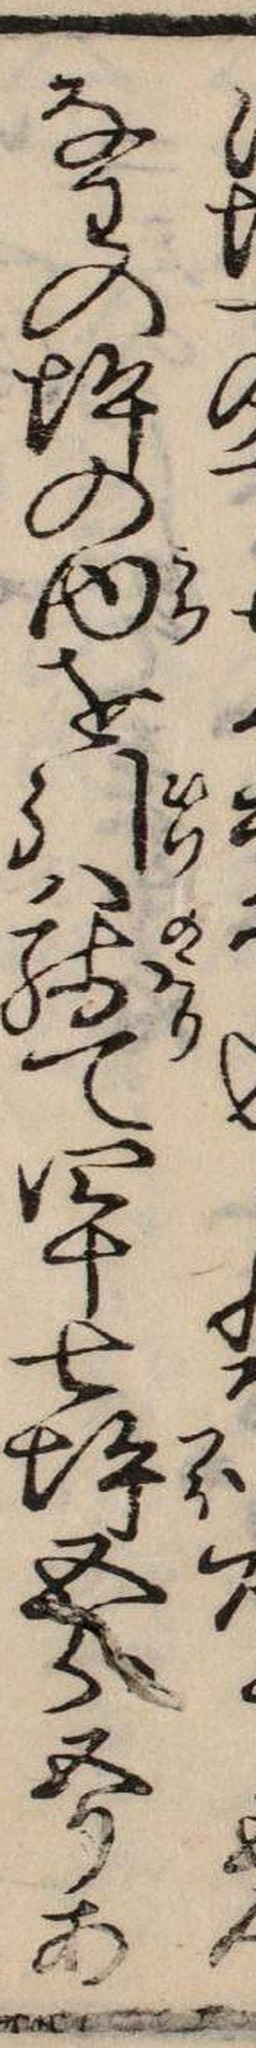なわの坪の内を引は残て四十七坪五分五りあ
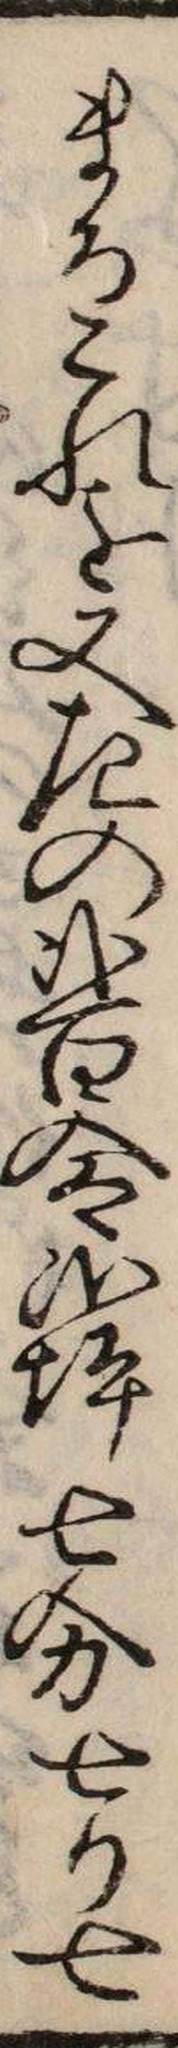まるこれを又左の弐百令弐坪七分七り七
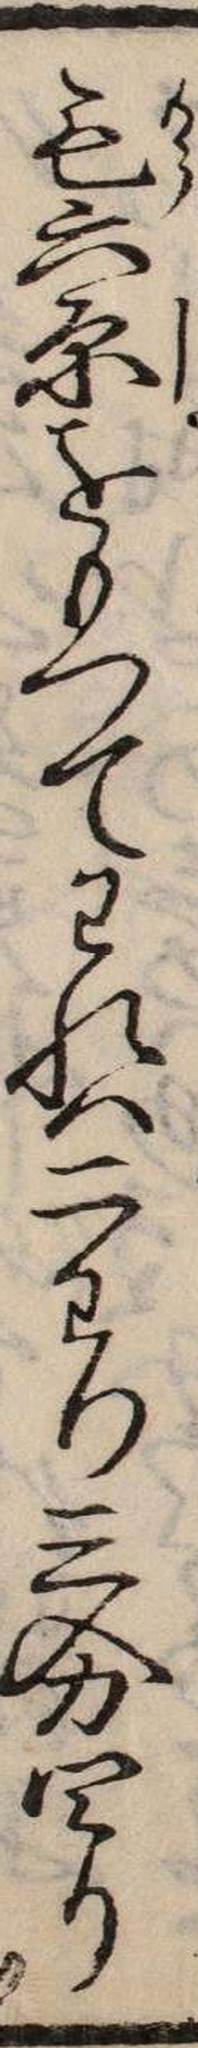毛六糸をもつてわれは二わり三分四り
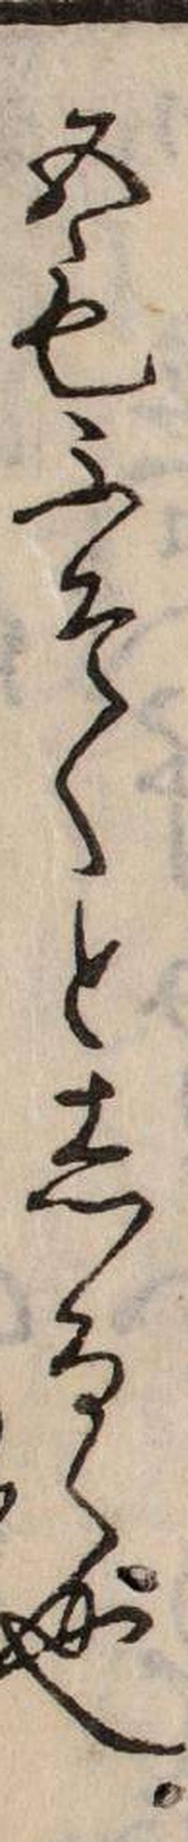五毛ふそくとしるゝ也
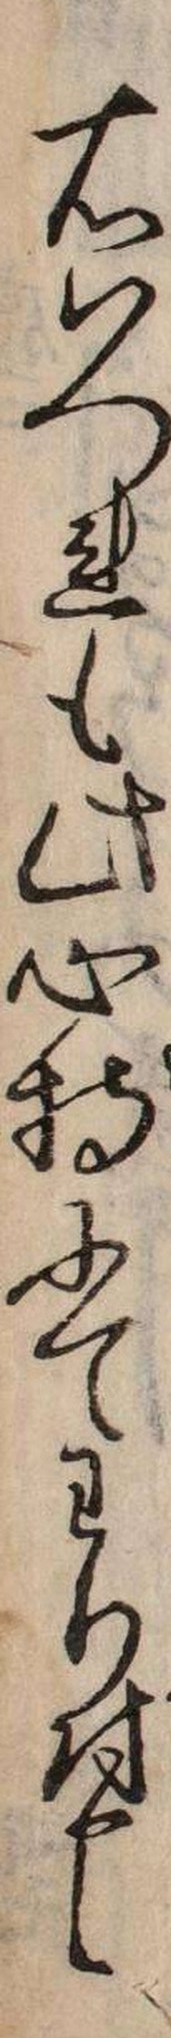右いつれも此心持にてわり付申候

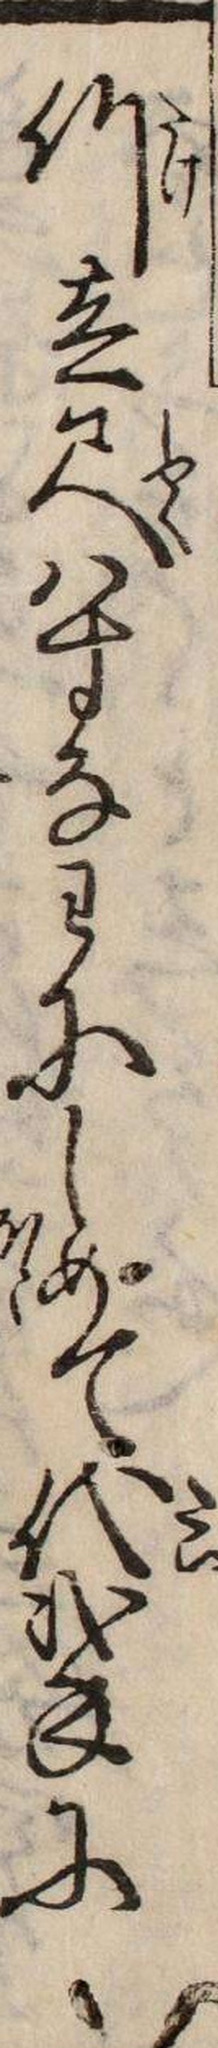竹壱尺八寸なわにしめて代弍匁に
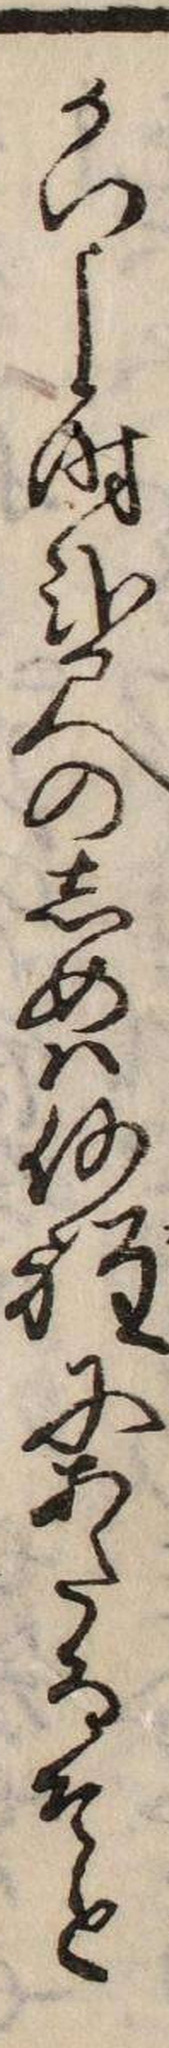かい申候時弍尺のしめは何程にあたるそと
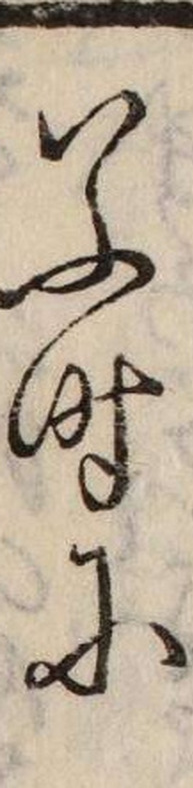いふ時に
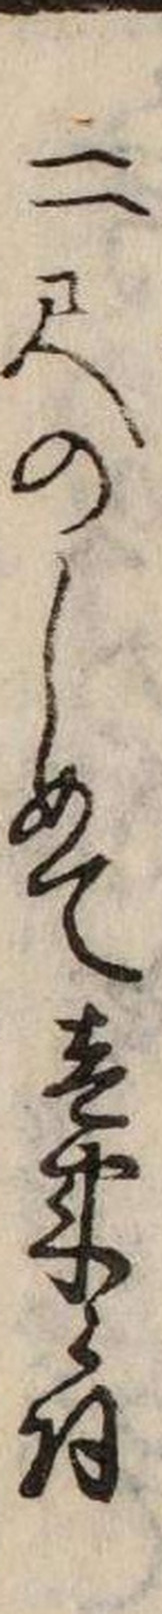二尺のしめて壱束に付
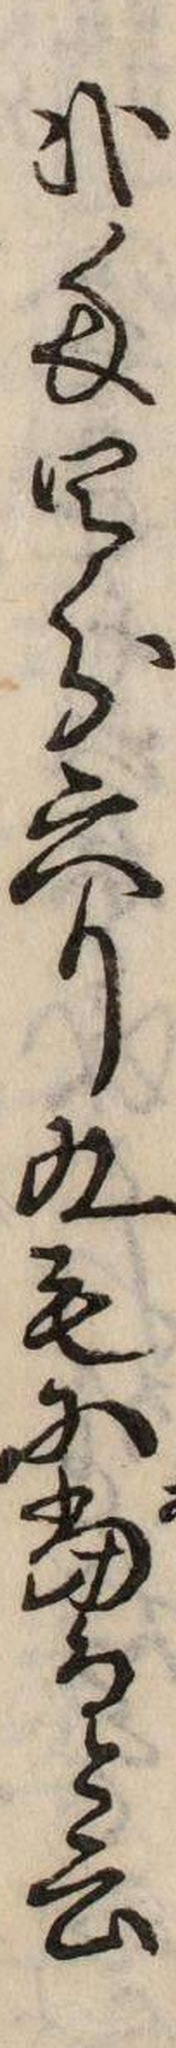弍匁四分六り九毛に当ると云
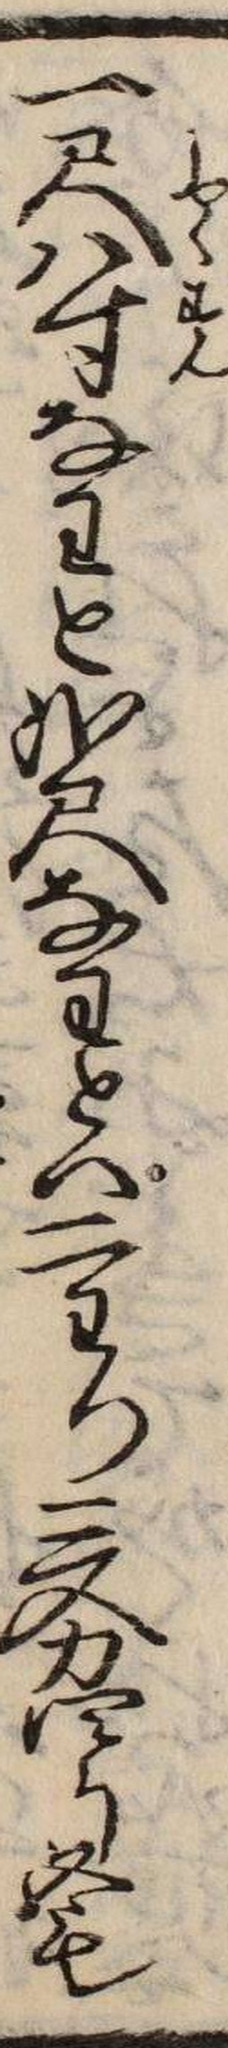一尺八寸なわと弍尺なわとは二わり三分四り五毛
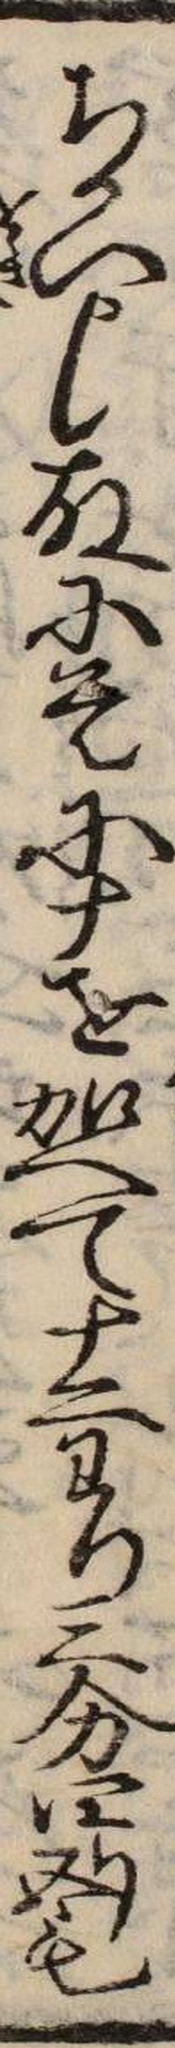ちかい申候故に是に十を加へて十二わり三分四り五毛
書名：塵劫記（寛永11年自跋、京都府立京都学・歴彩館追貴8）
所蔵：京都府立京都学・歴彩館 国文学研究資料館
